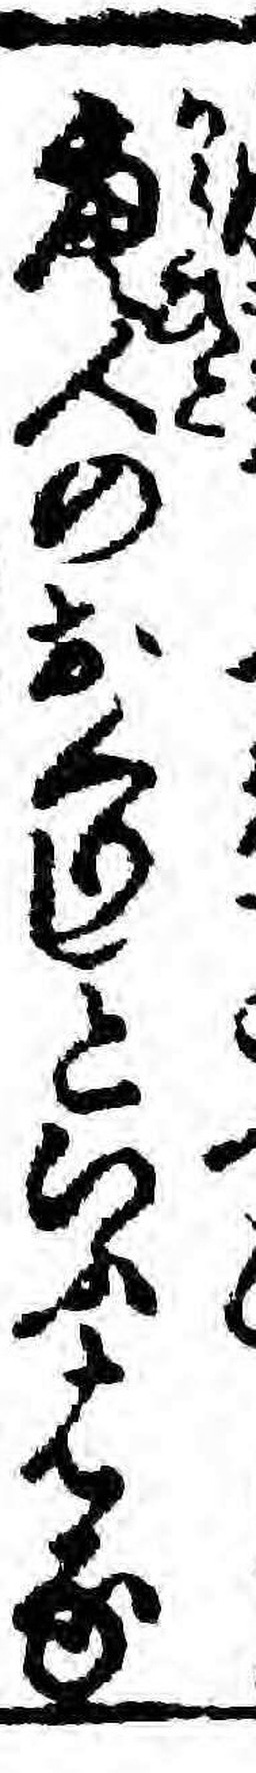唐人のおくりしといふはな
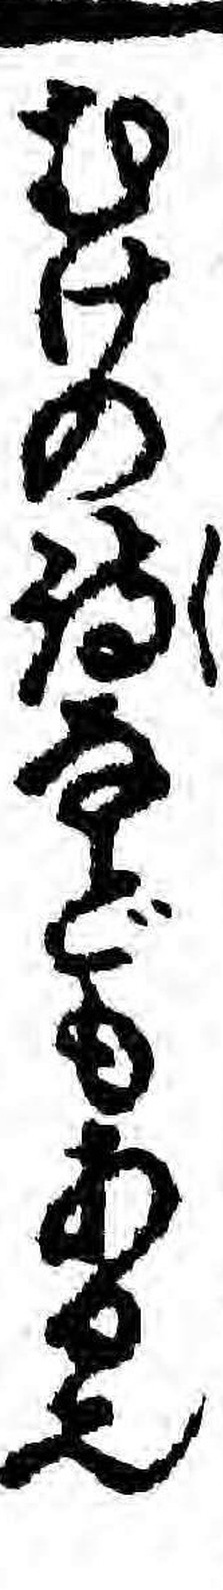むけの詩などもある也
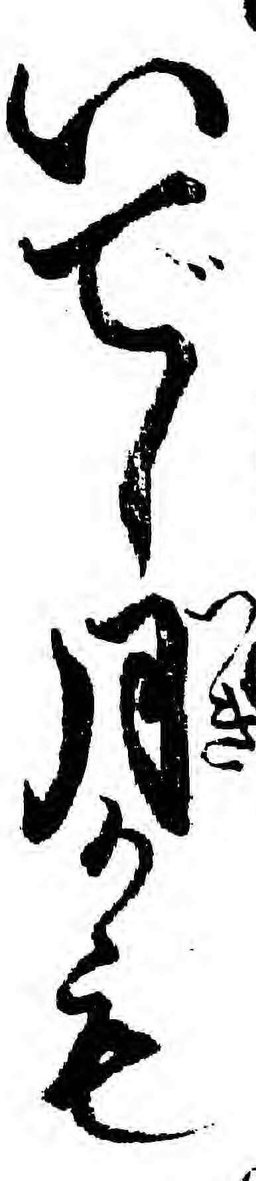いでし月かも

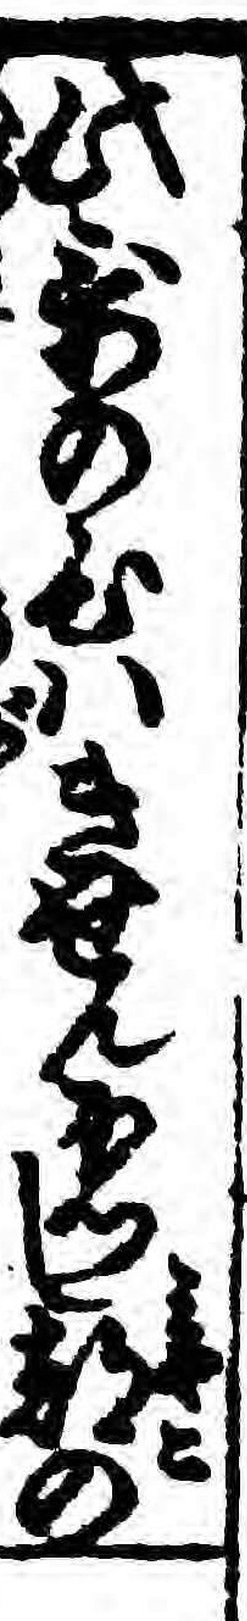此哥の心はきせんほつし都の
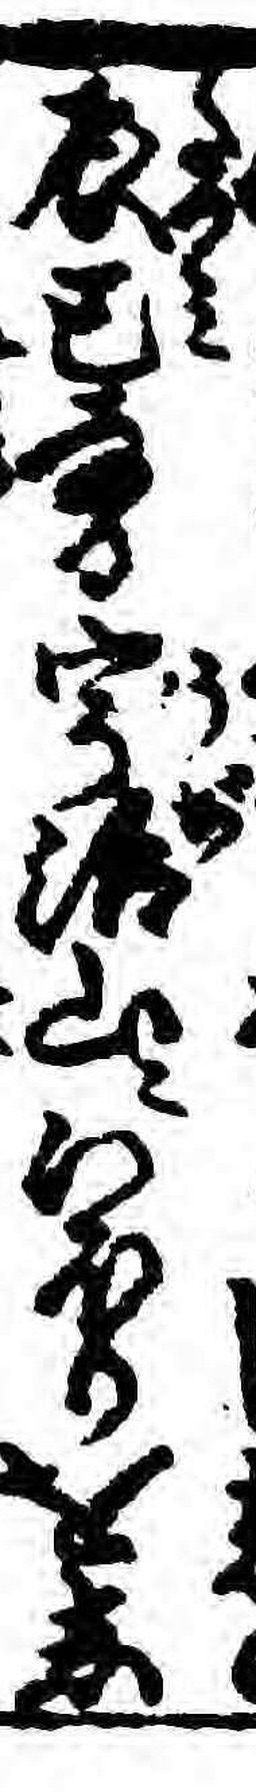辰巳なる宇治山にいほりをし
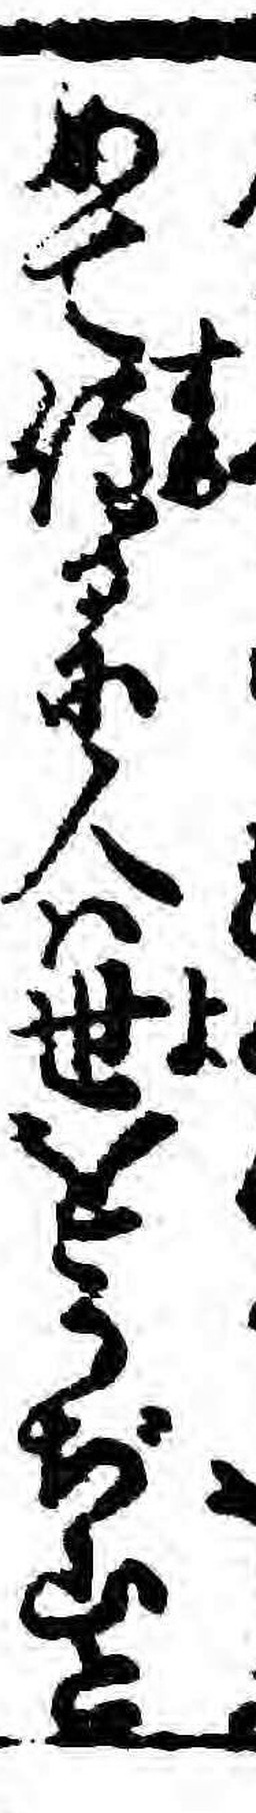めて住るに人は世をうぢ山と
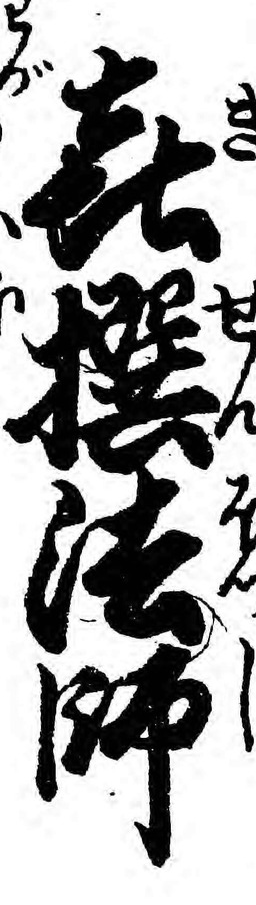喜撰法師
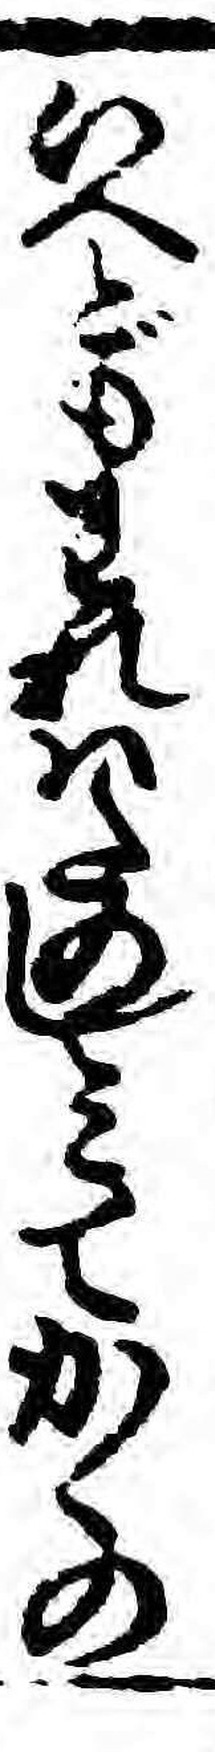いへどもわれはたのしみてかくの
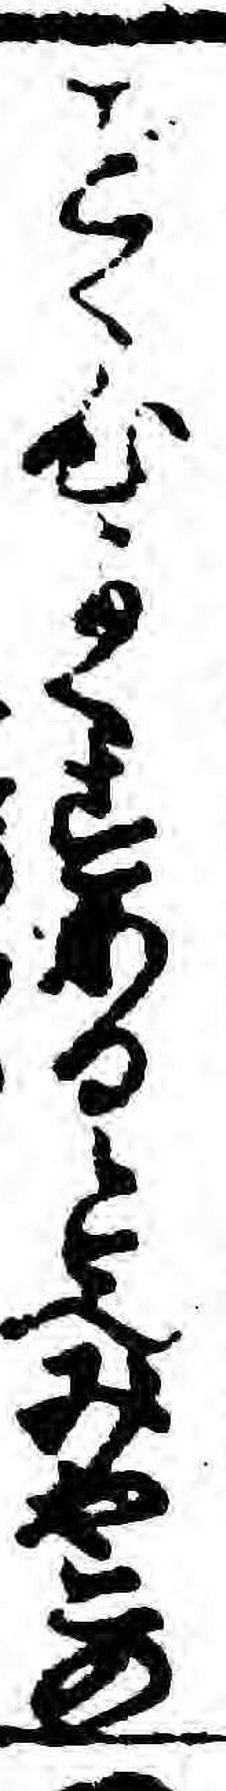ごとく心よくすめると也みやこの
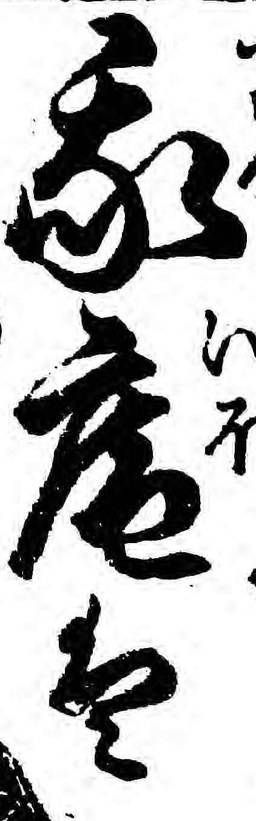我庵は
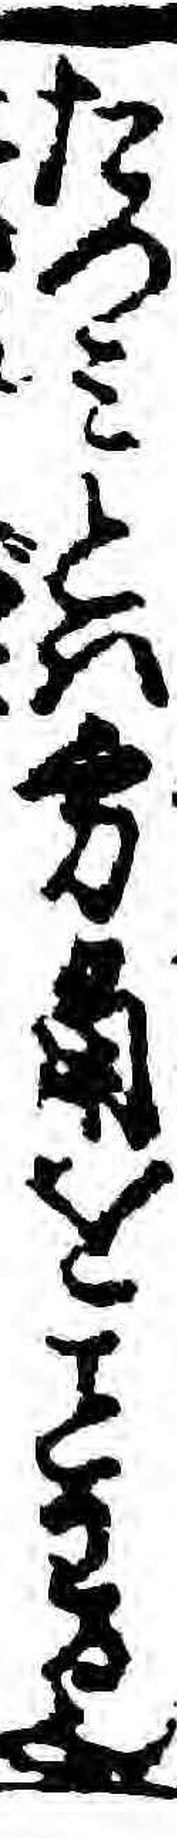たつみとは方角をことわる也
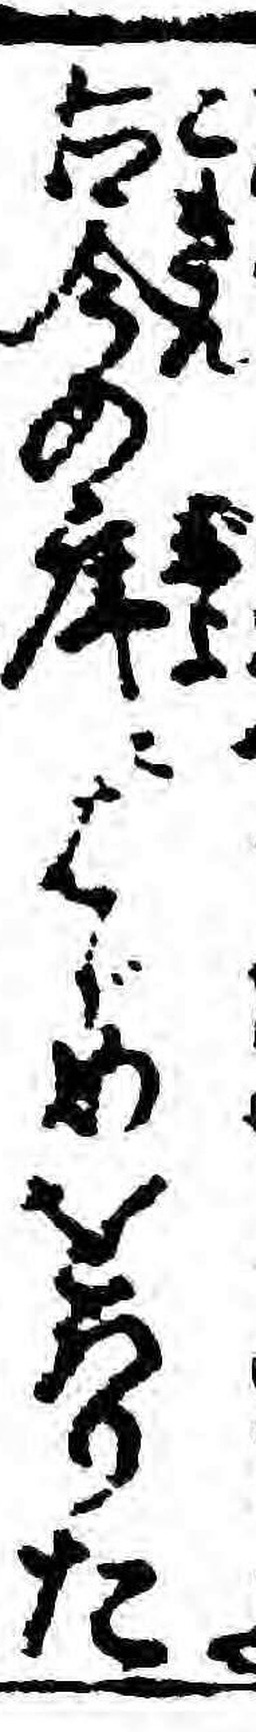古今の序にはじめをはりた
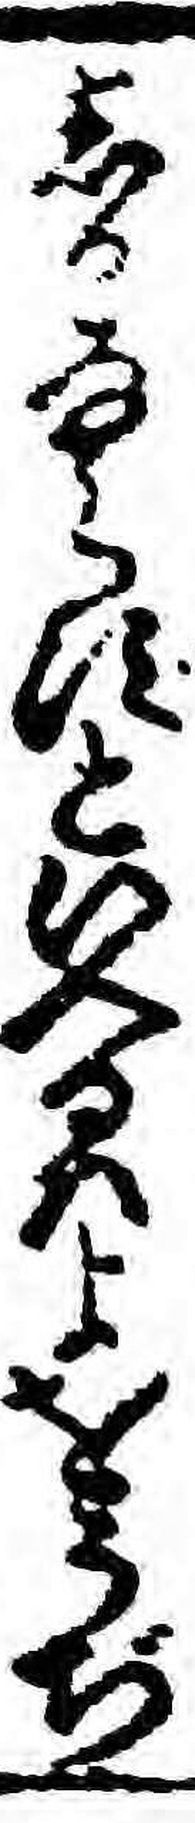しかならずといへるはよをうぢ
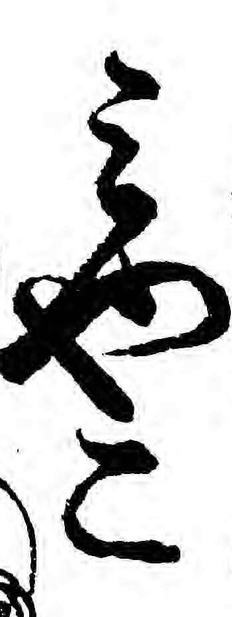みやこ
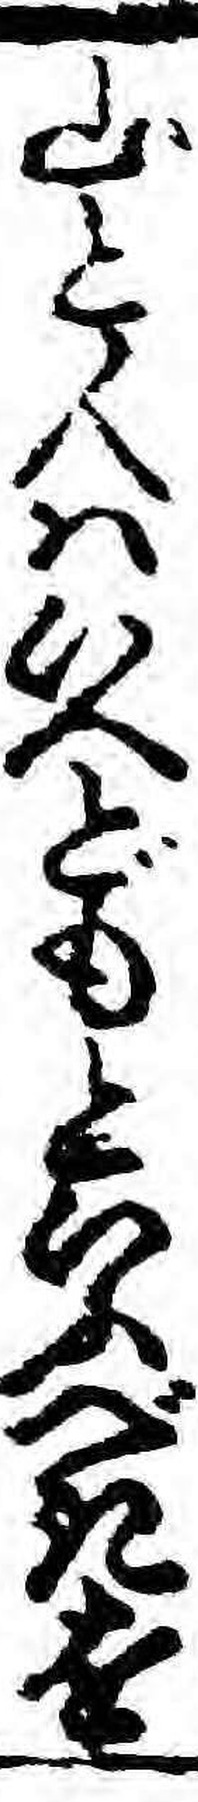山と人はいへどもといふべきを
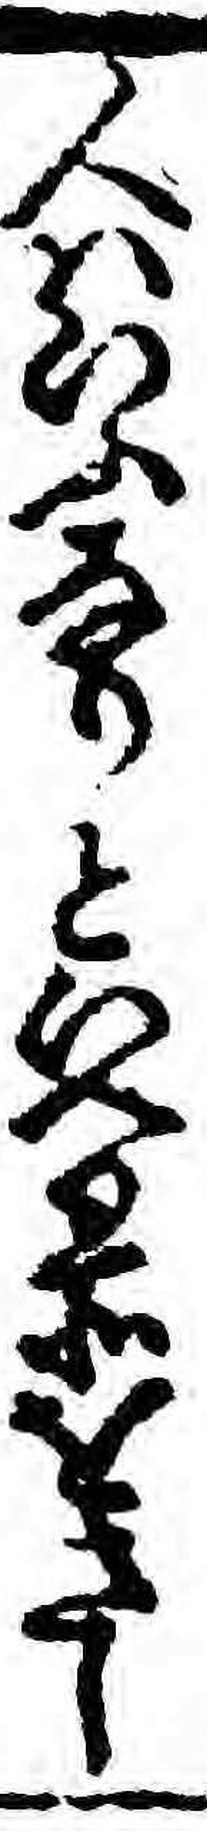人はいふなりといへる所をさし
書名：頭書和歌注譯／壽賀多百人一首小倉錦
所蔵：国文学研究資料館
